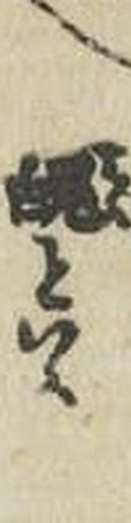魄といふ
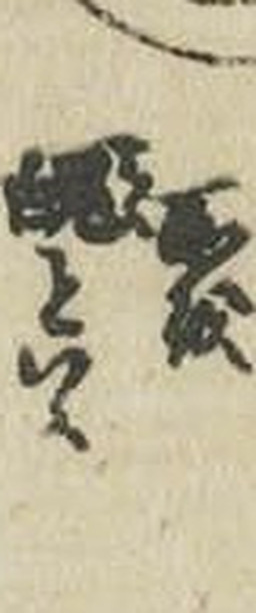魄といふ
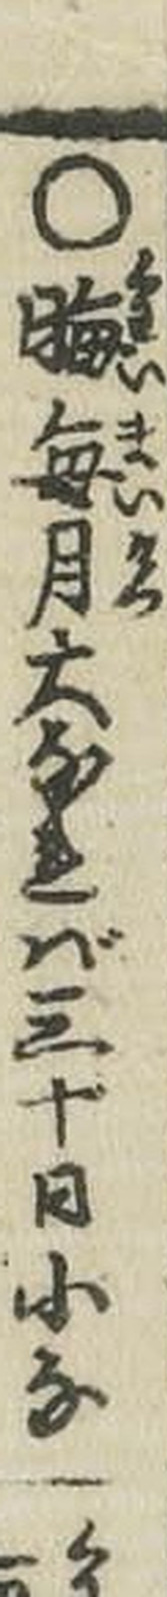○晦毎月大なれば三十日小な
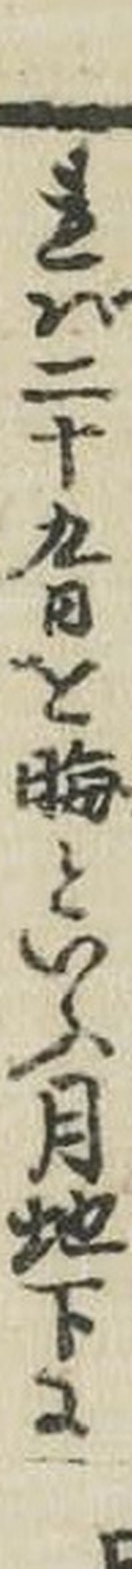れば二十九日を晦といふ月地下に
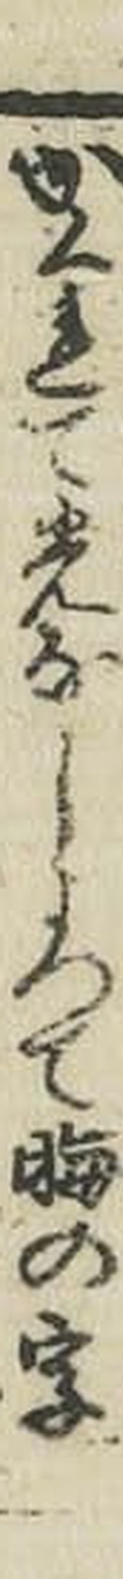かくれて光なしよつて晦の字
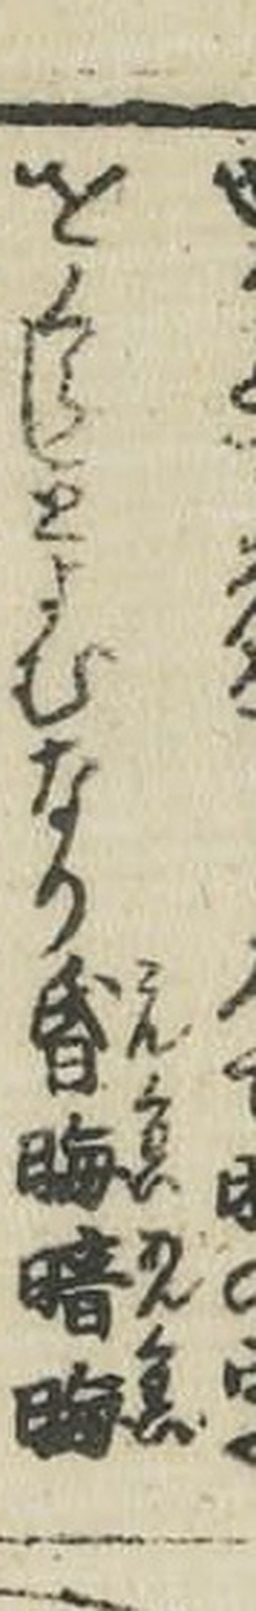をくらしとよむなり昏晦暗晦
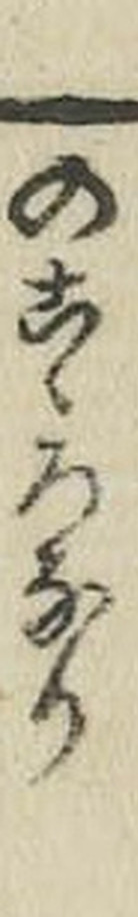のこゝろなり
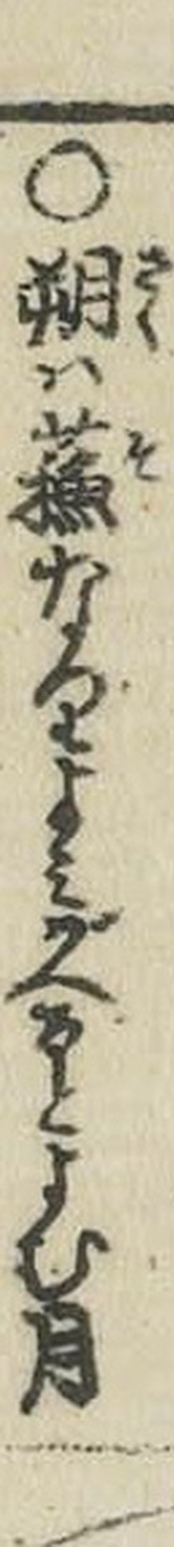○朔は蘇なりよみがへるとよむ月
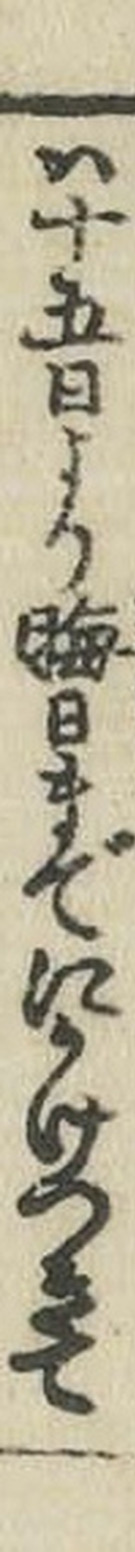は十五日より晦日までにかけつきて
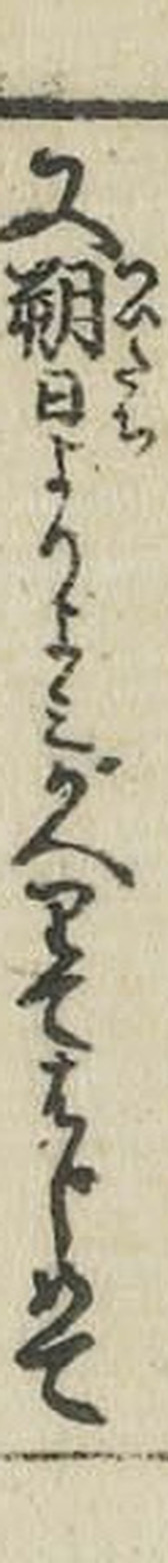又朔日よりよみがへりてはじめて
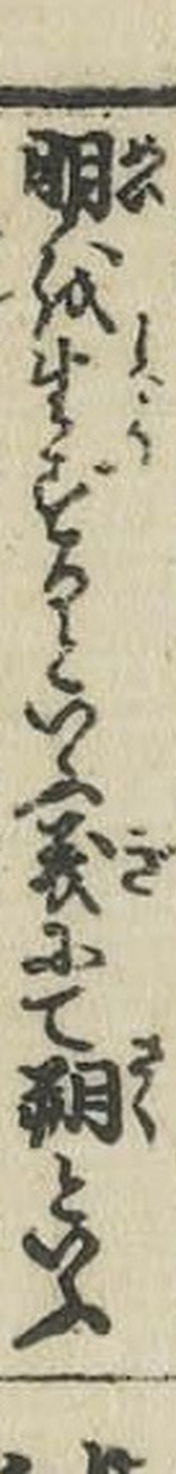明を生ずるといふ義にて朔といふ
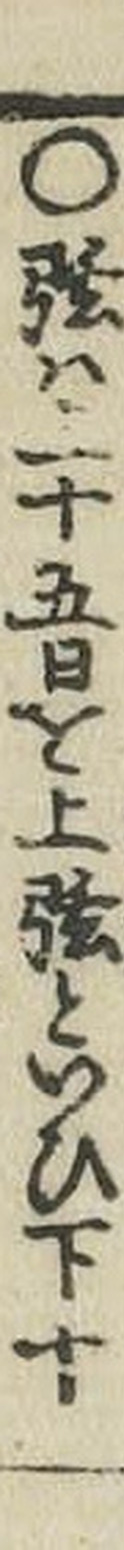○弦は上十五日を上弦といひ下十
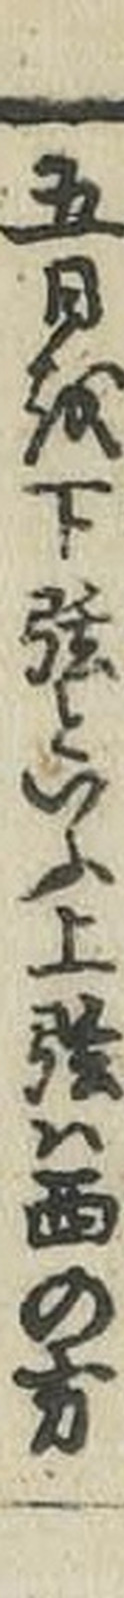五日を下弦といふ上弦は西の方
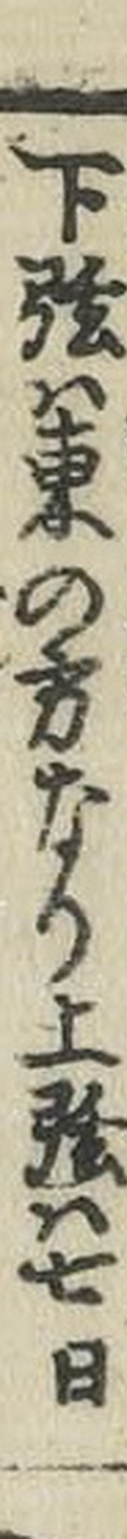下弦は東の方なり上弦は七日
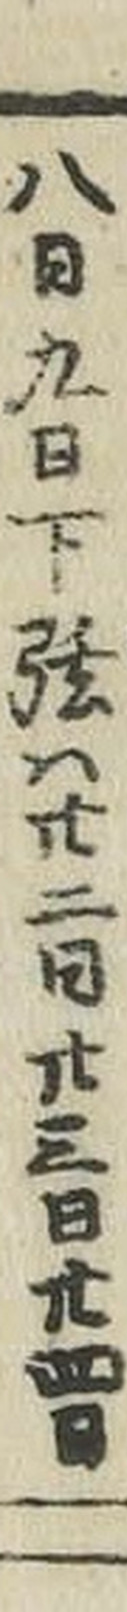八日九日下弦は廿二日廿三日廿四日
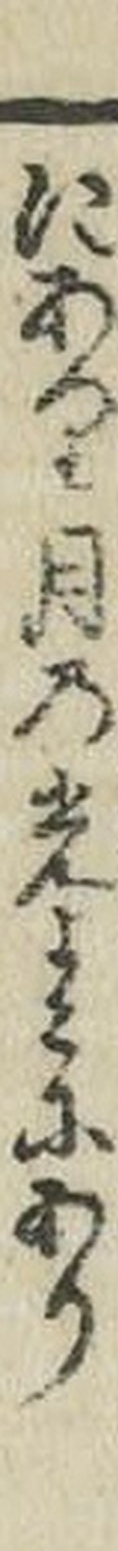にあり月の光よこにあり
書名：増補頭書訓蒙図彙大成 10巻 2:巻之1-3
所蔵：東京学芸大学教育コンテンツアーカイブ
